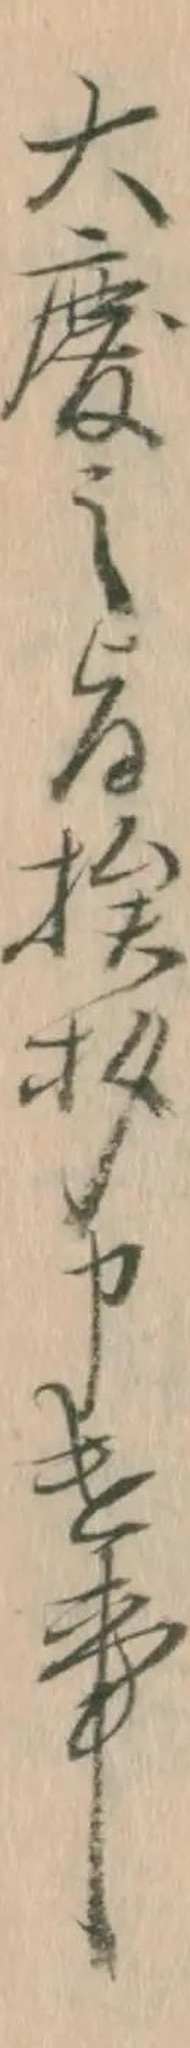大慶之旨挨拶申事
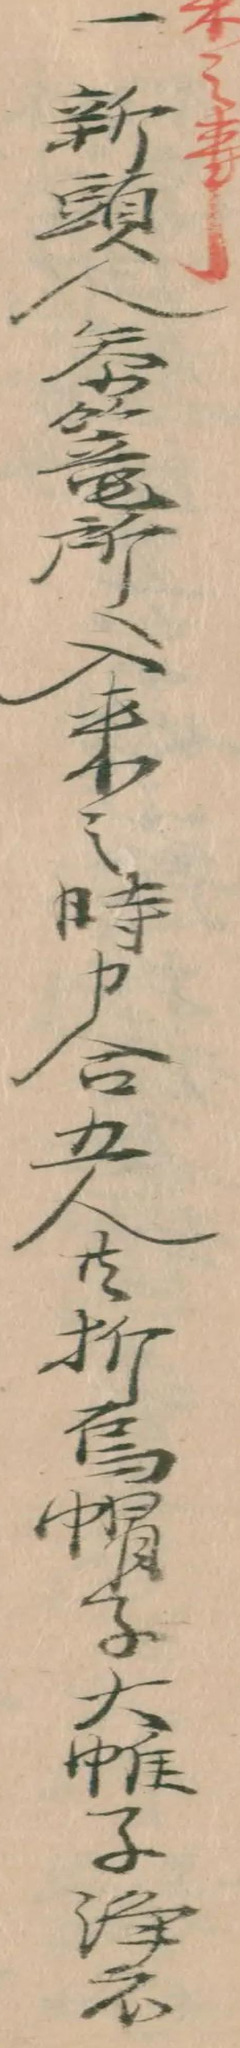一新頭人参籠所へ入来之時申合五人共折烏帽子大帷子浄衣
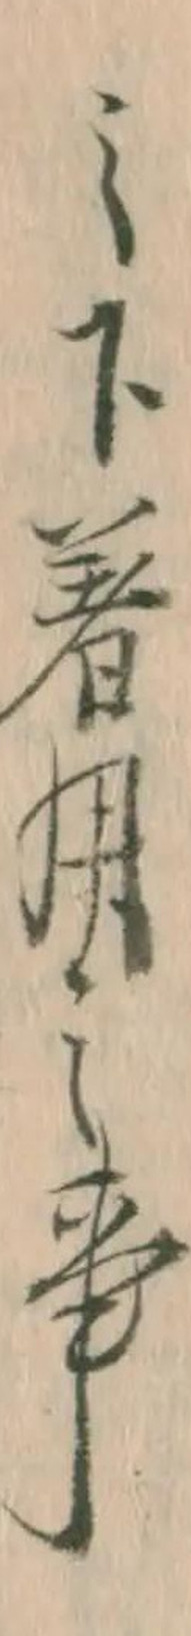之下着用之事
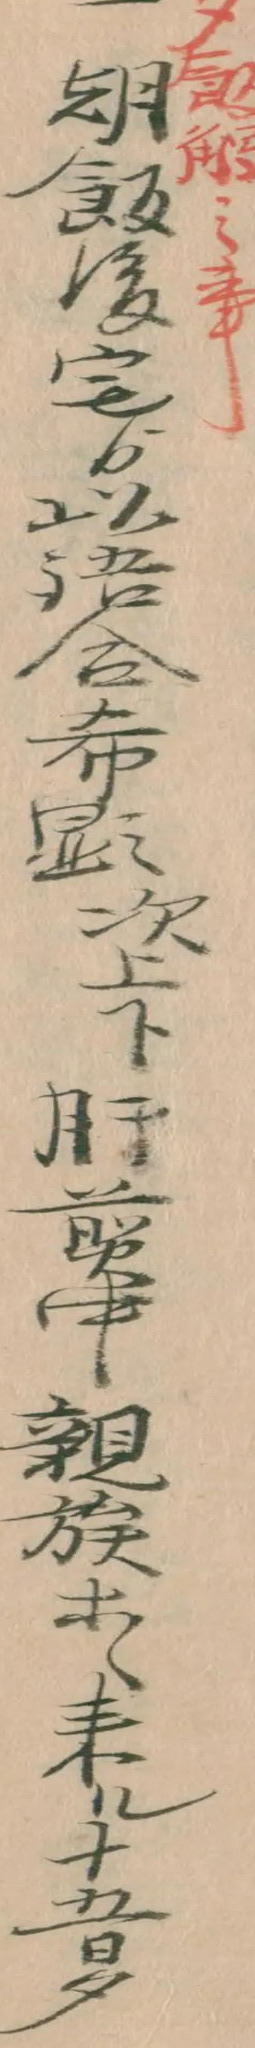一朝飯後宅ゟ以詰合希顕次上下肝煎中親族等へ来ル十五日夕
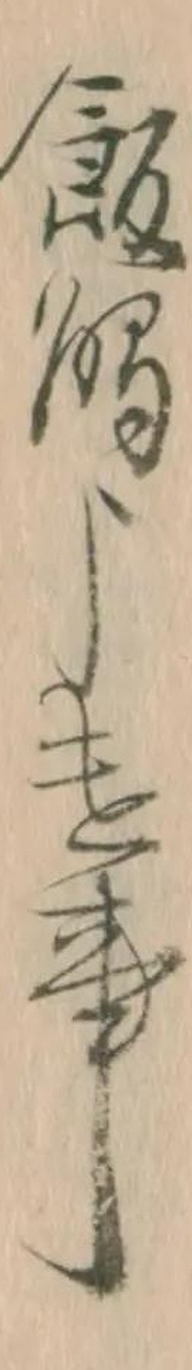飯觸申遣事
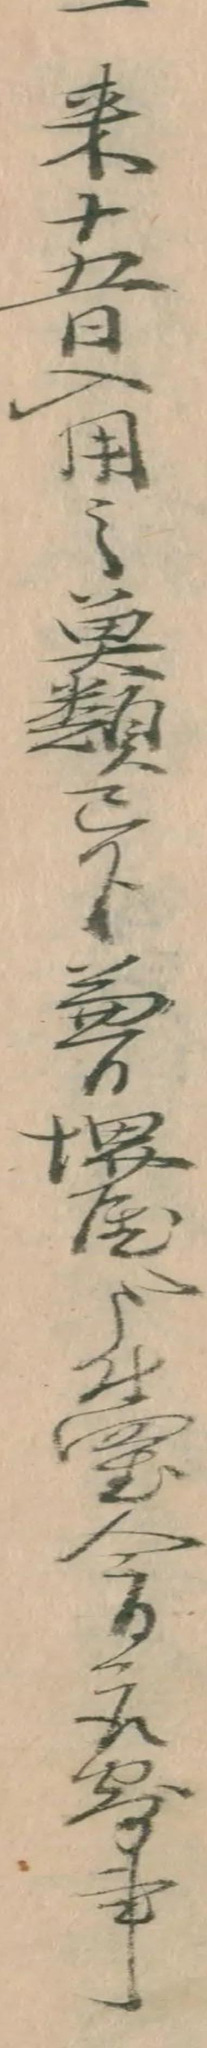一来十五日入用之魚類已下兼而堺屋へ申付置今日取寄事

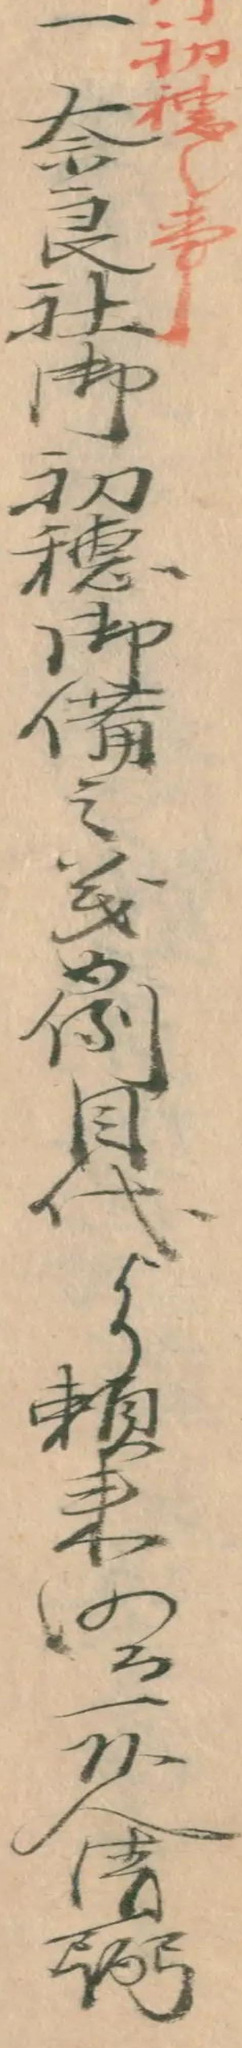一奈良社御初穂御備之義御如例目代より頼来仍而一頭人清弼
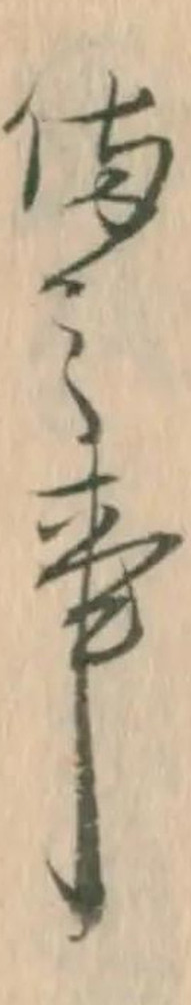備之事
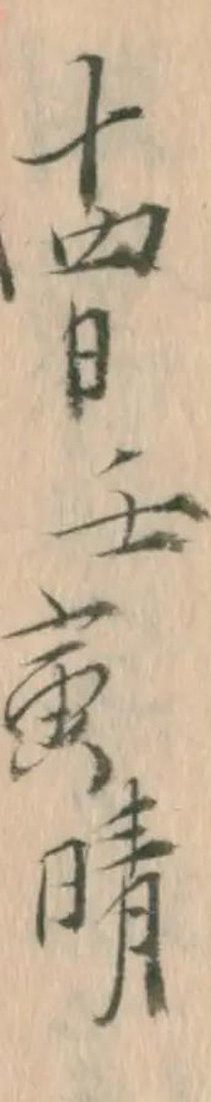十四日壬寅晴
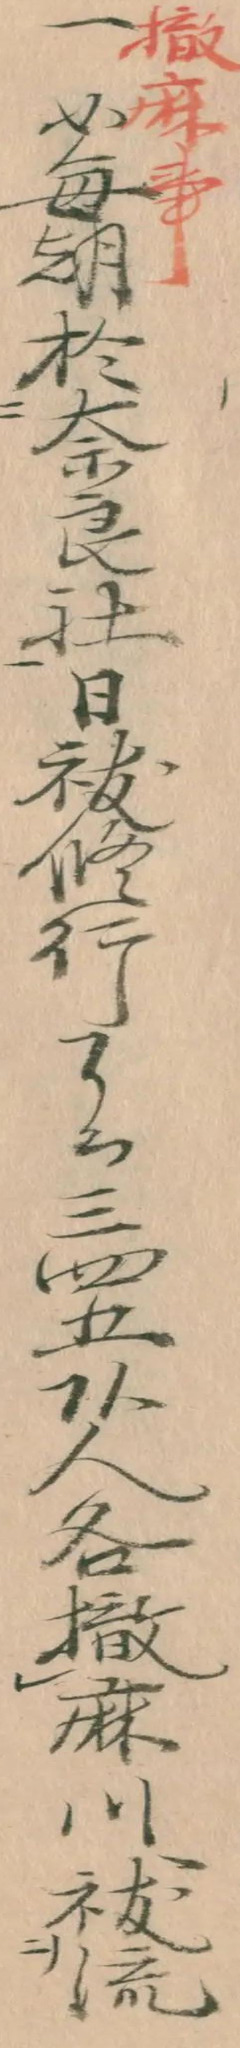一如毎朝於奈良社日祓修行了而三四五頭人各撒麻川祓流
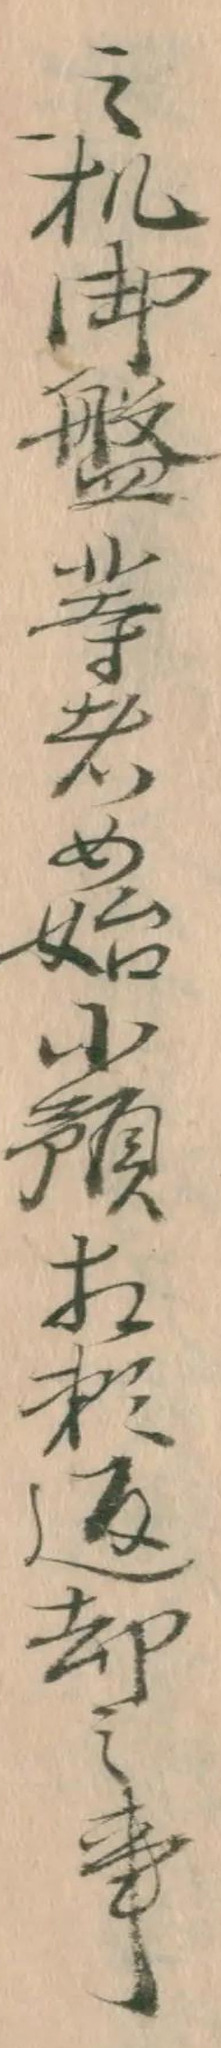之机御盤等者如始小頭相頼返却之事
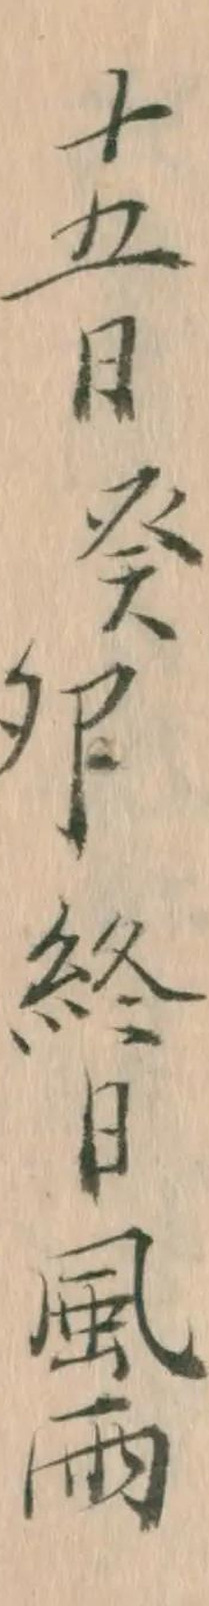十五日癸卯終日風雨
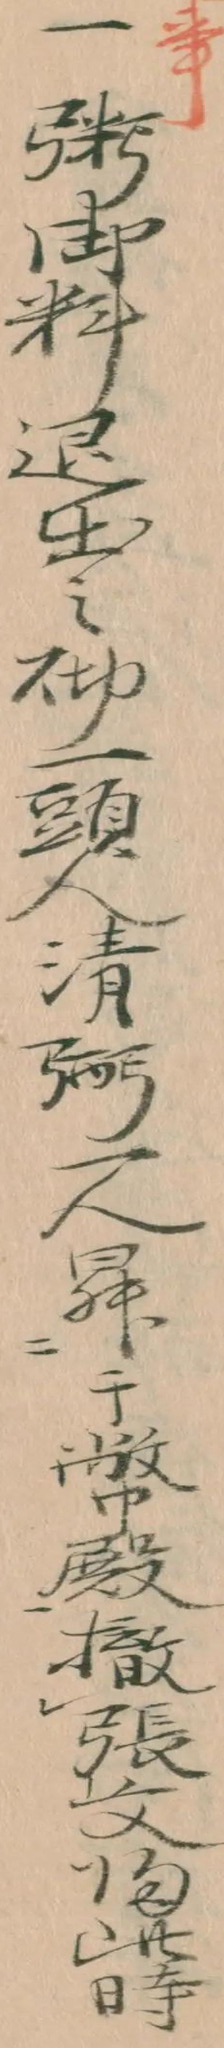一粥御料退出之砌一頭人清弼一人昇于幣殿撒張文帰此時
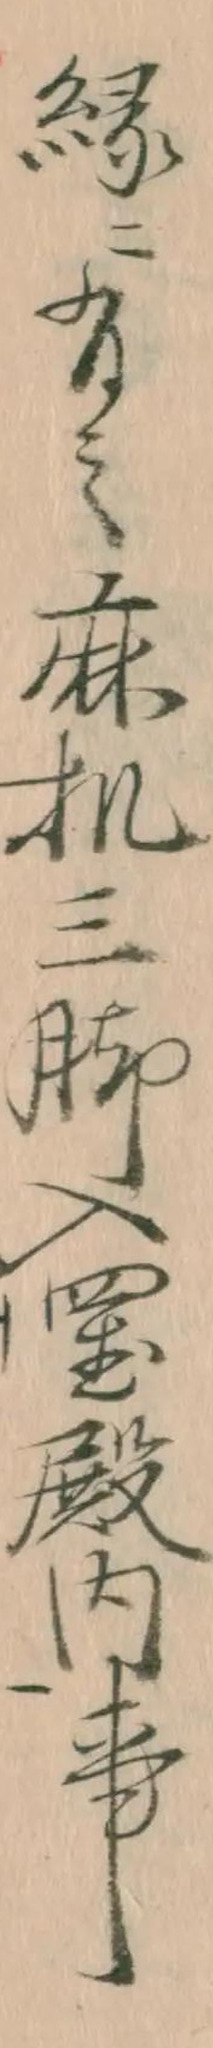縁ニ有之麻机三脚入置殿内事
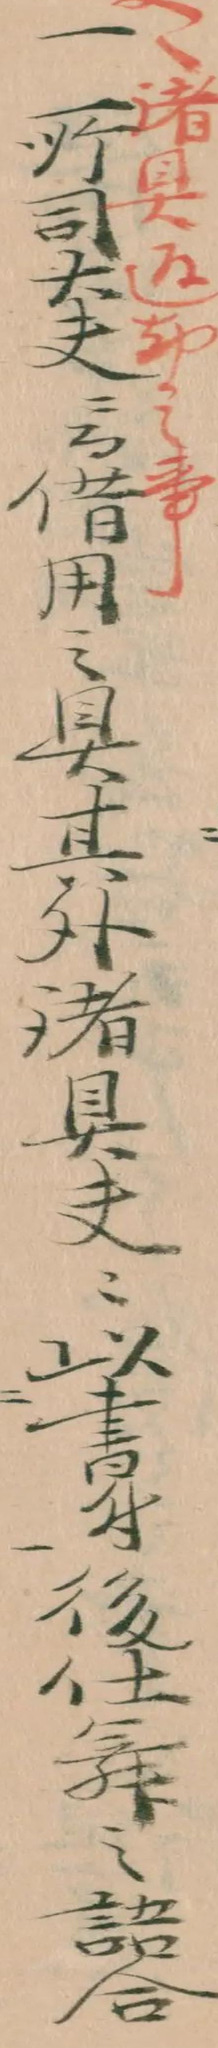一所司大夫ニ而借用之具其外諸具夫々以書付後仕舞之語合
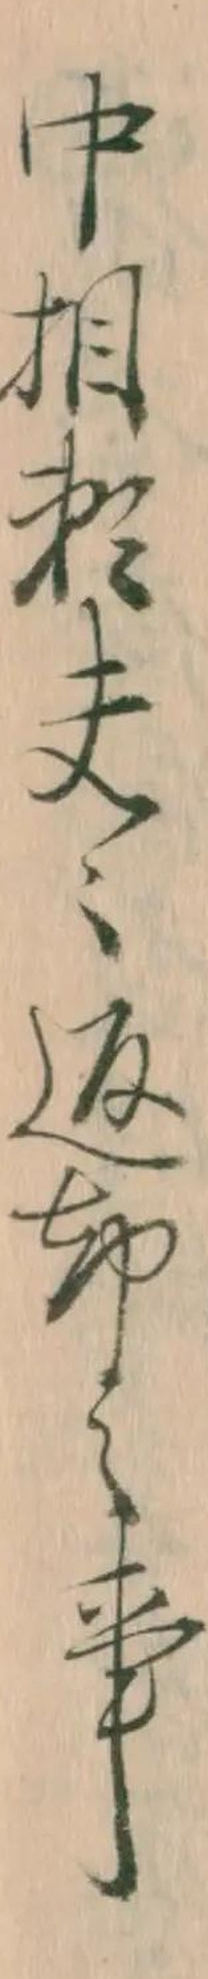中相頼夫々返却之事
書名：賀茂社記録. 第74冊
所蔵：国立国会図書館 National Diet Library, JAPAN
